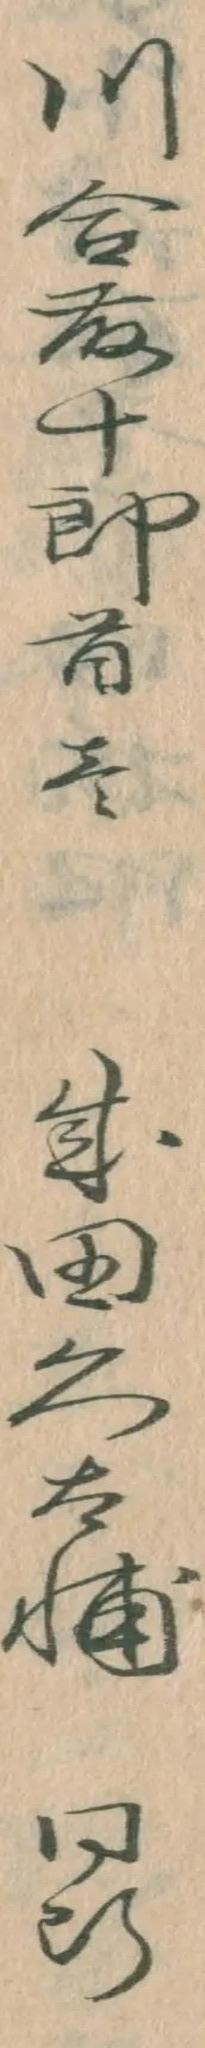川合藤十郎首壱成田久太輔同断
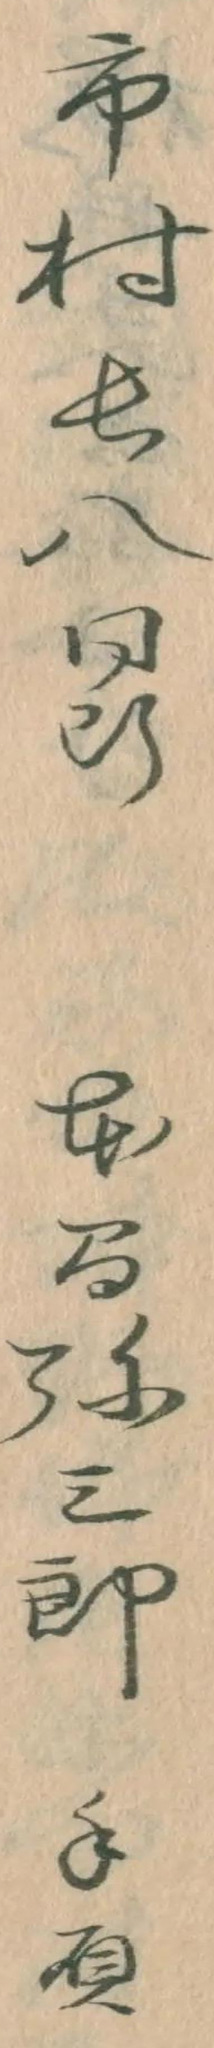市村長八同断本間弥三郎手負

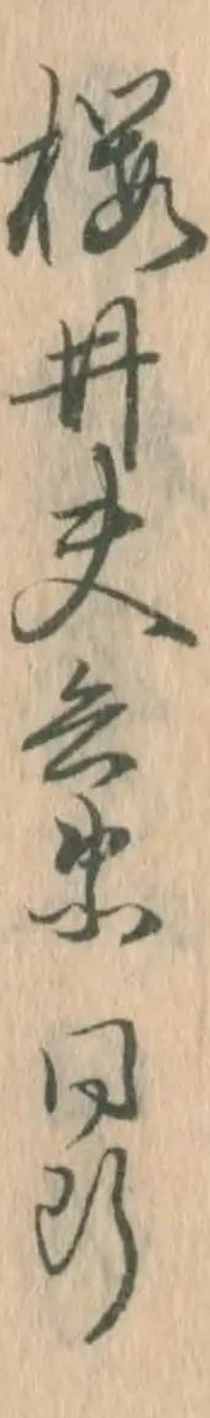桜井夫兵衛同断
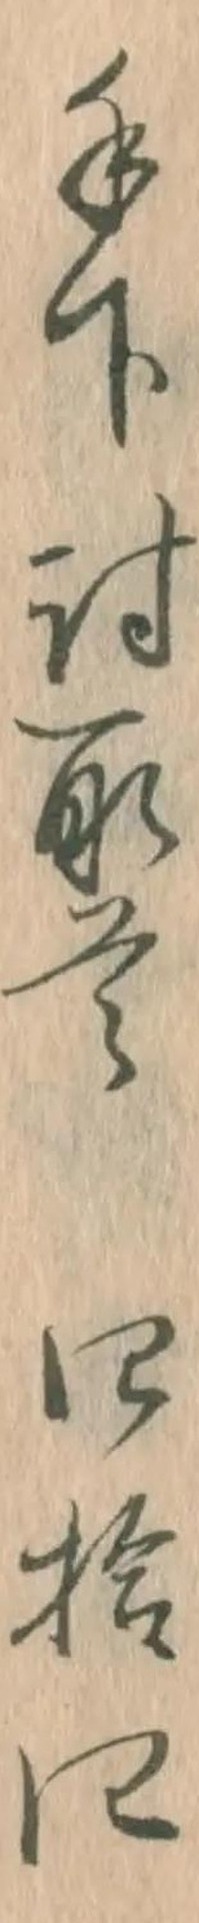手下討取首四拾四
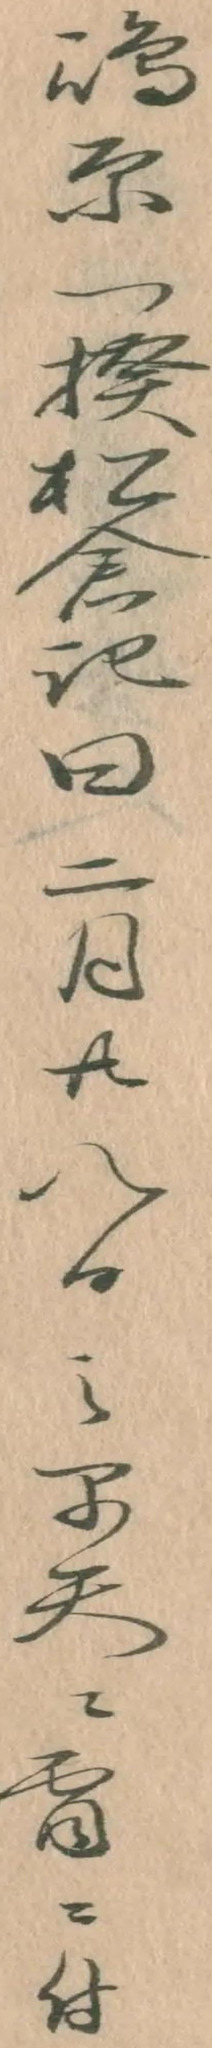島原一揆松倉記曰二月廿八日之早天に雪に付
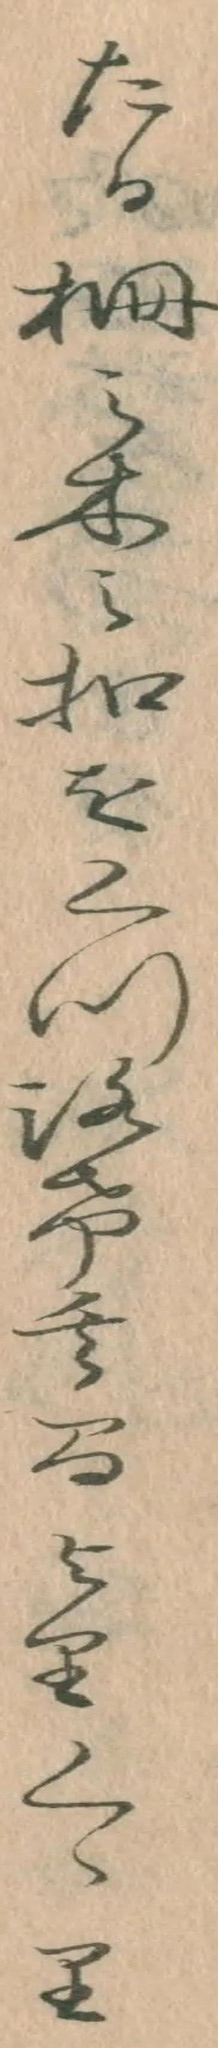たる柵之木之扣をく川路希其間与里くゝ里
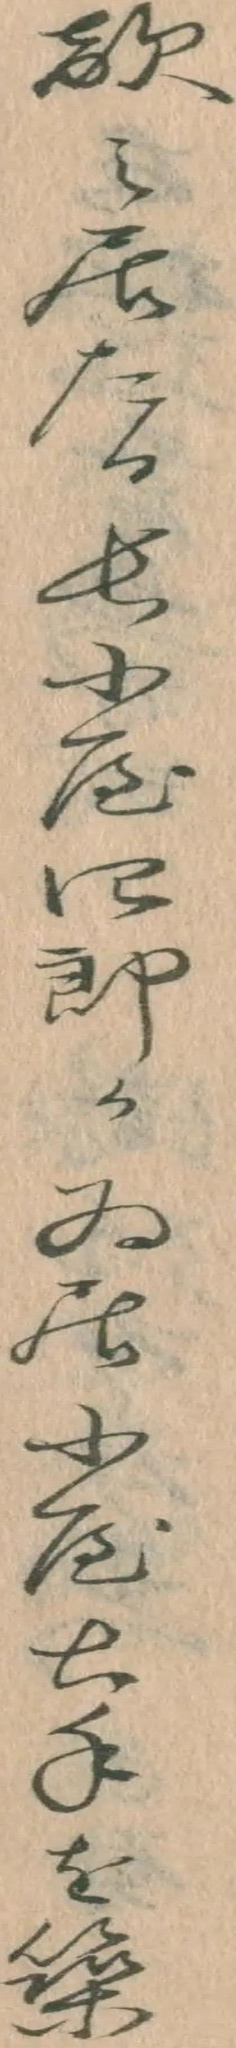敵之居たる長小屋四郎かゐ居小屋土手を築
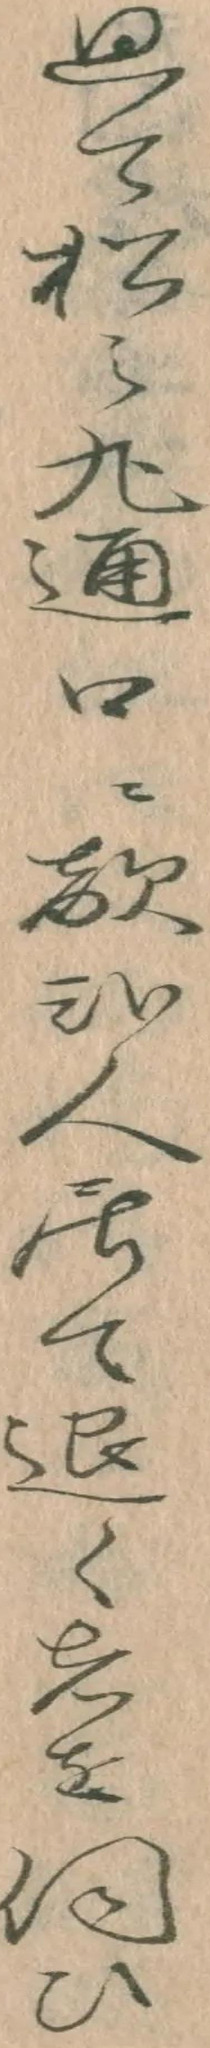廻て松之丸通口に敵弐人居て退く者を伺ひ
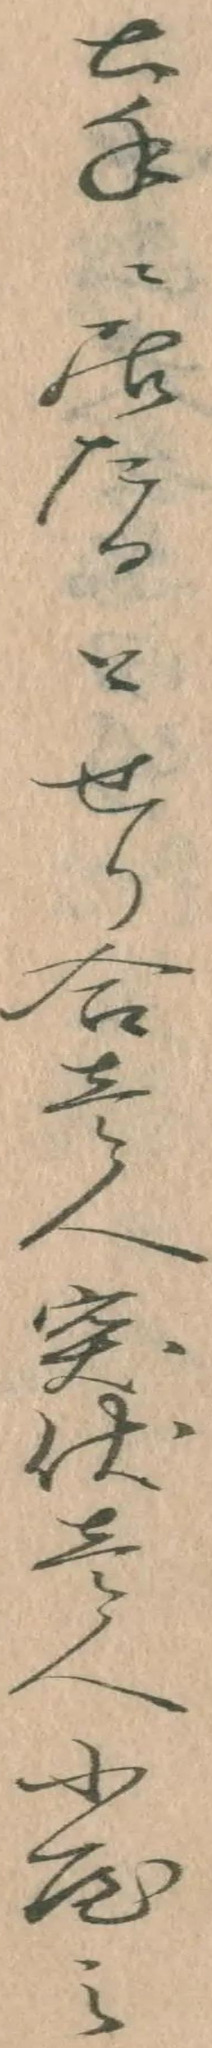土手に居たるとせり合壱人突伏壱人小屋之
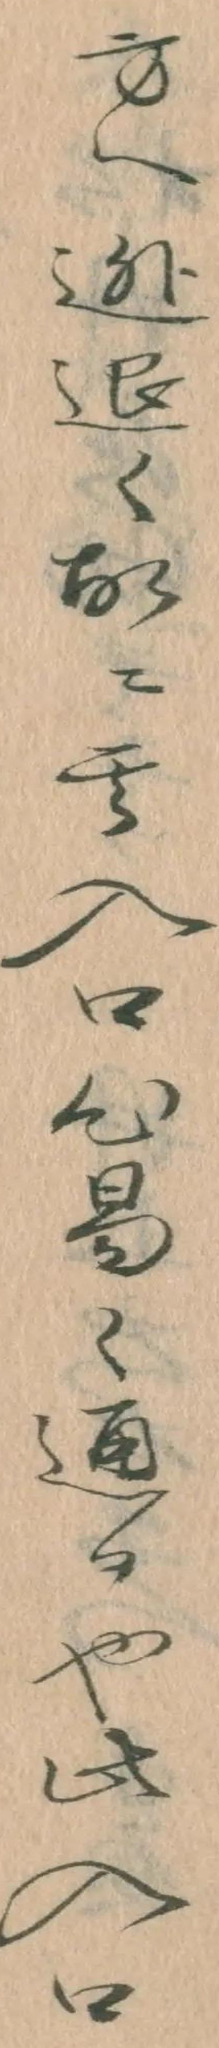方へ逃退く故に其入口心易く通る也此入口
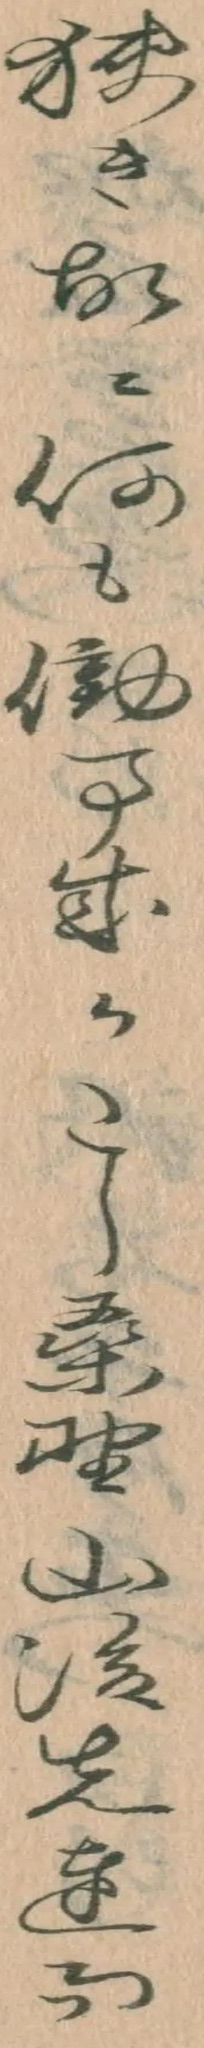狭き故に何も働事成かこし桑野山後先達而
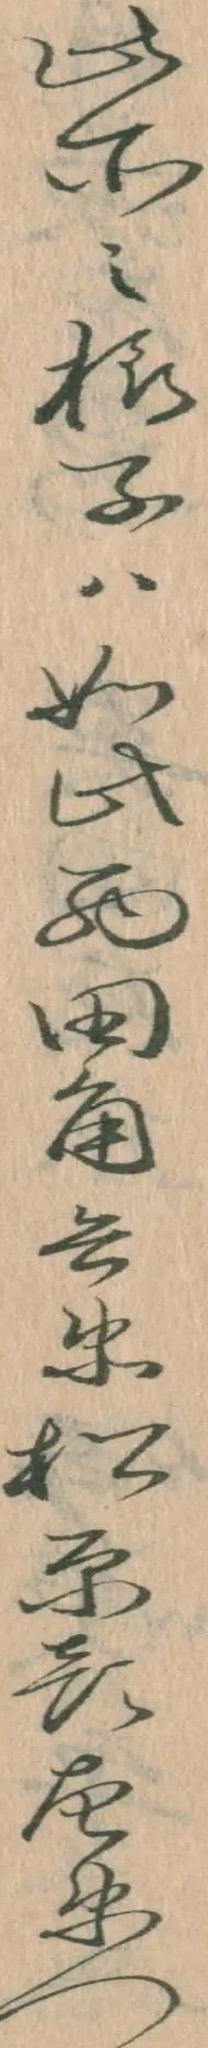此所之様子は如此西田角兵衛松原彦左衛門
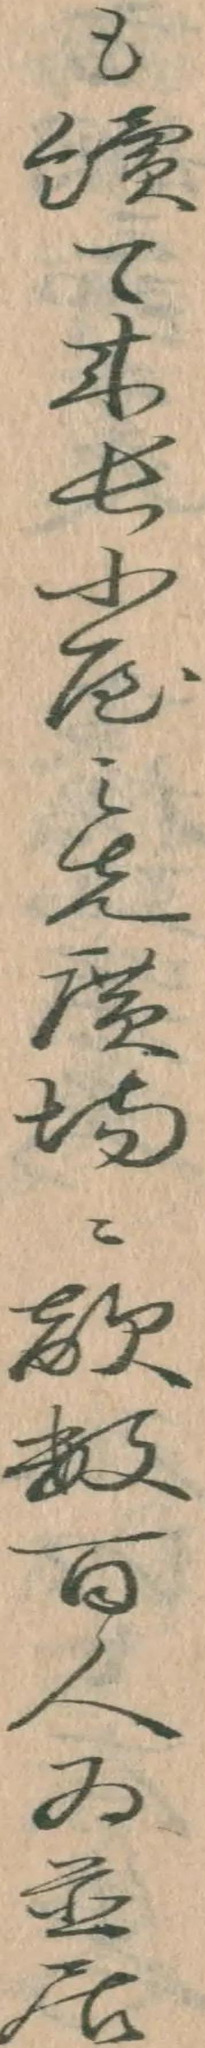も続て来長小屋之先広場に敵数百人ゐ置居
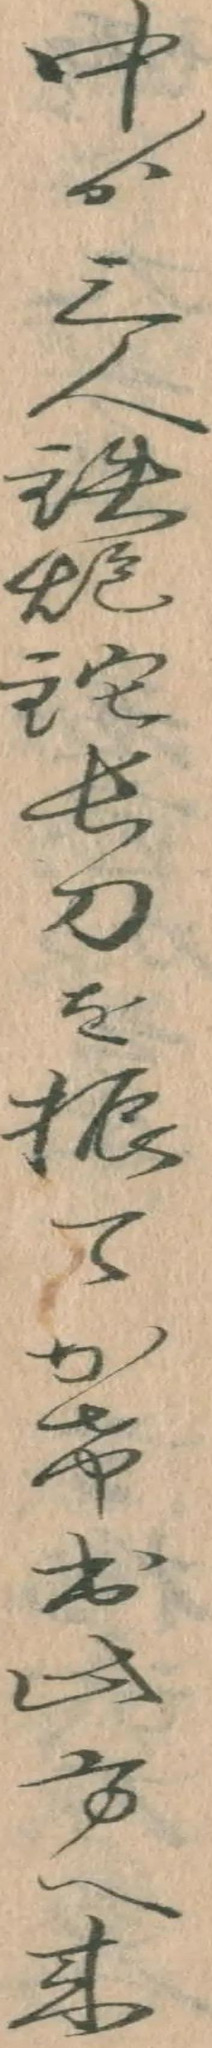中ゟ三人鉄砲鉈長刀を振て加希出此方へ来
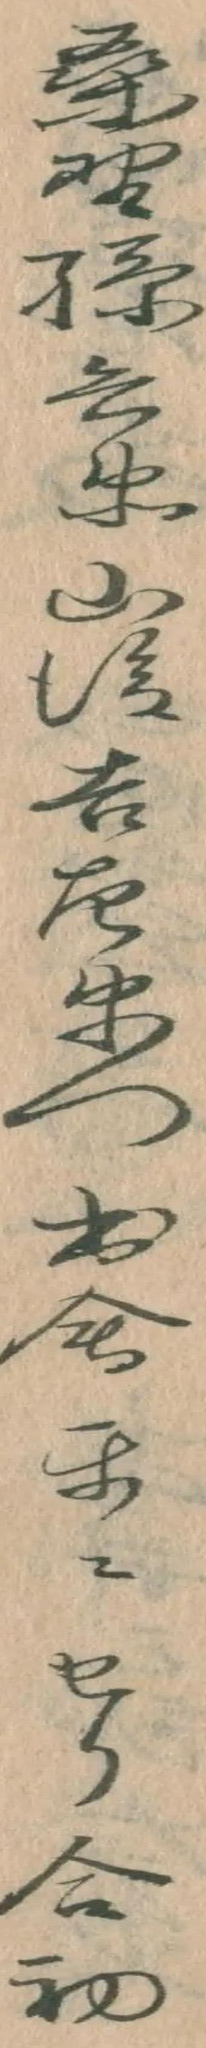桑野孫兵衛山後吉左衛門出会互にせり合初
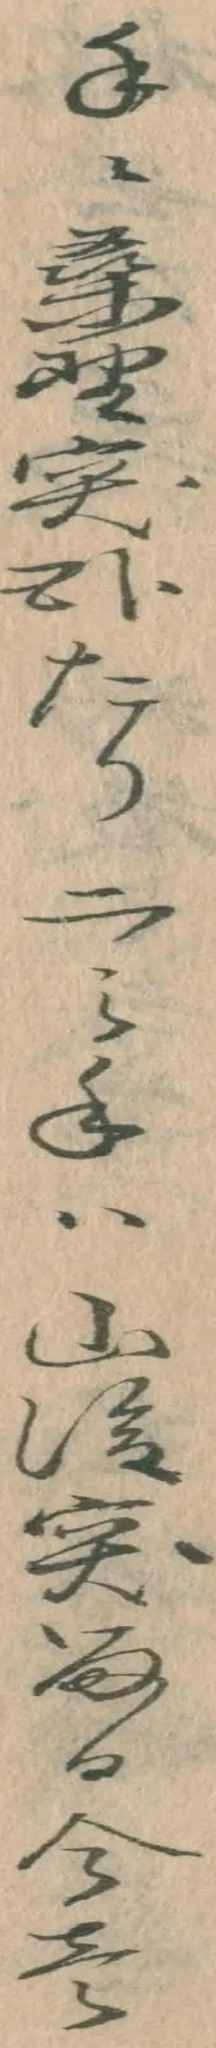手に桑野突臥たり二之手は山後突留る今壱
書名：切支丹御退治記 49巻. [9]
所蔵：国立国会図書館 National Diet Library, JAPAN
